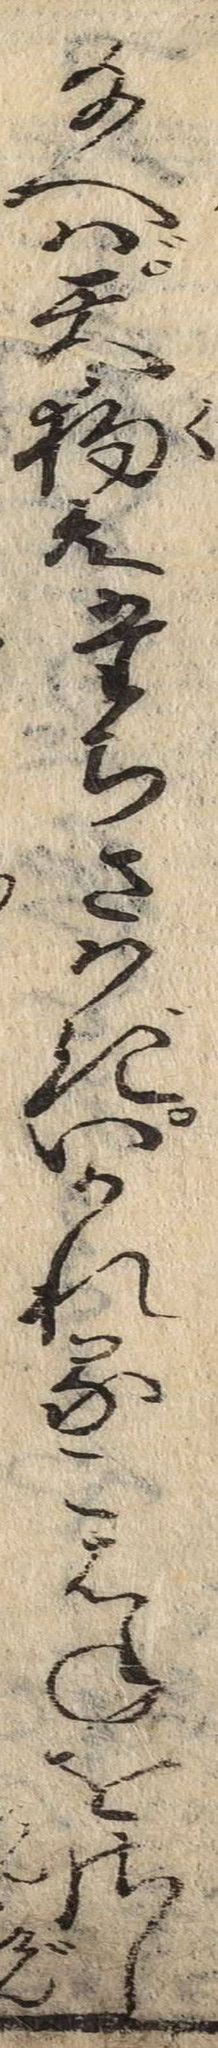給へば。天狗共たちさはぎ。いかれるこはねをさし
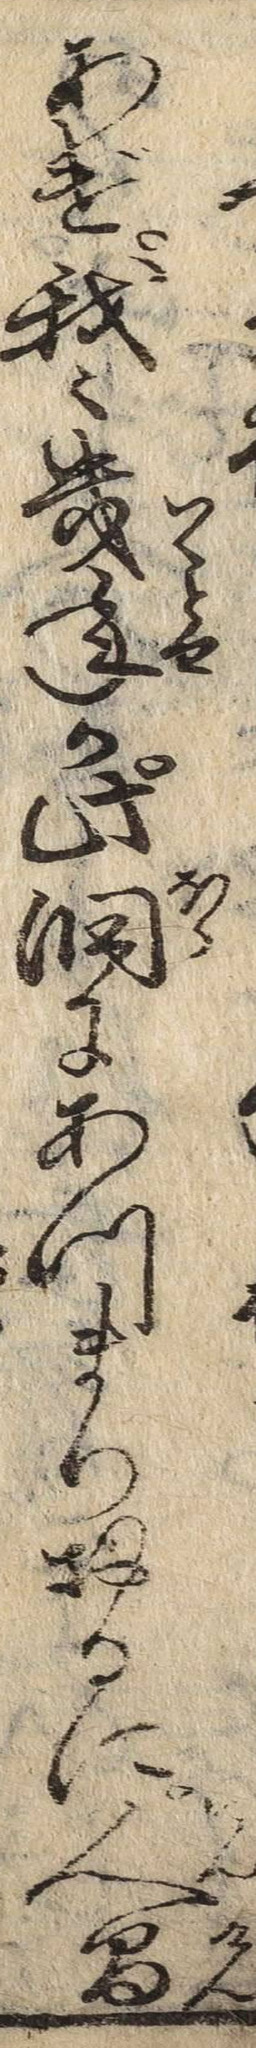あげ。我々幾年か。此洞にあつまりおるに。人間
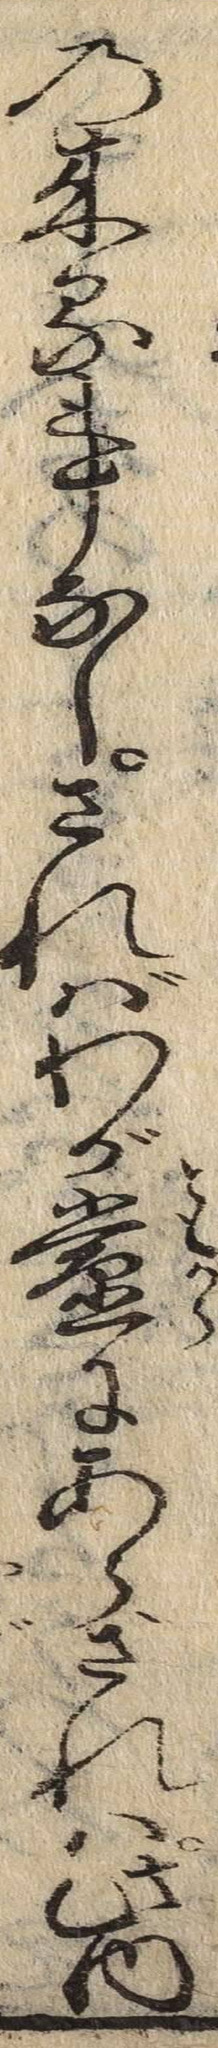の来る事なし。さればわが輩にあらざれは。此内
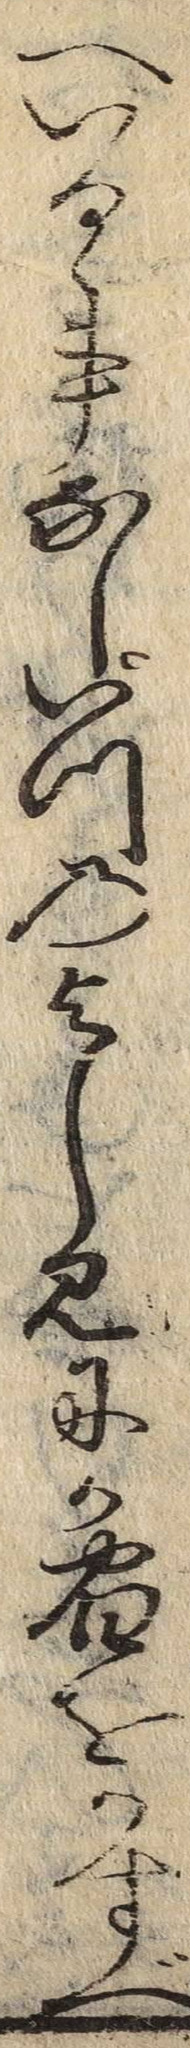へいる事なし。いつのよしみにか宿をかすべ
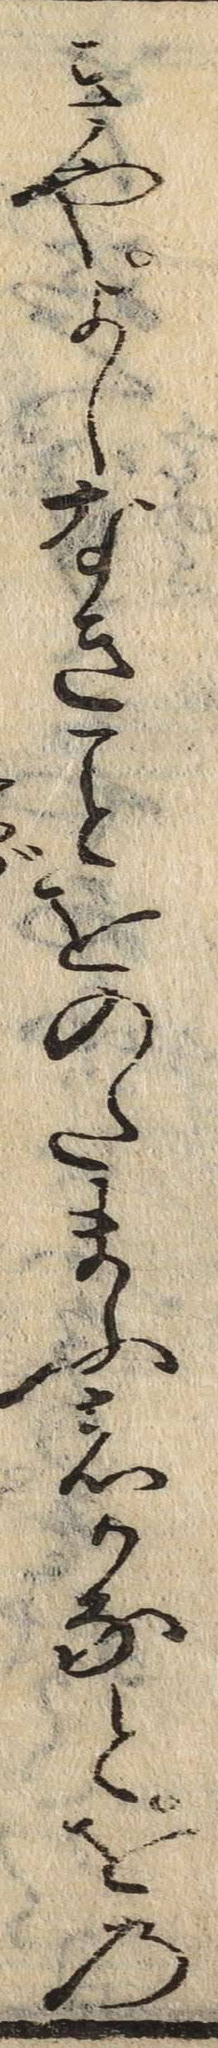きや。よしなきことをのたまふ物かなと。おの
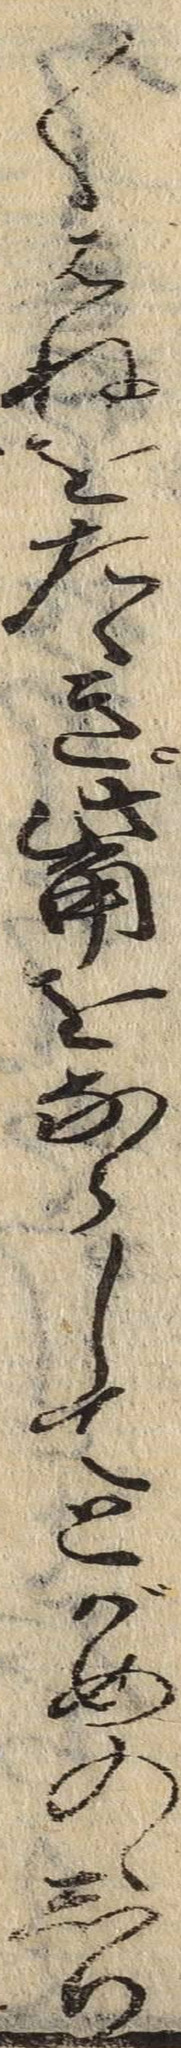〳〵はねをたゝき。觜をならしてとがめのゝしり
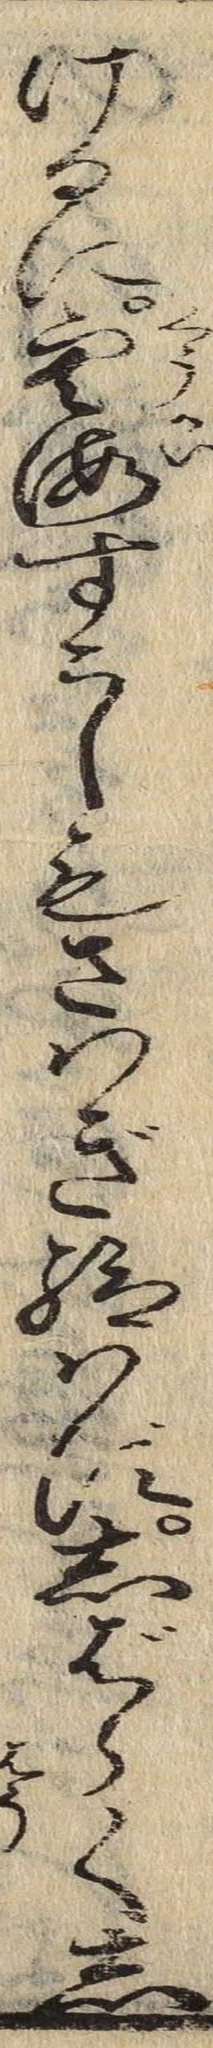けるに。空海すこしもさはぎ給はず。しばらくし
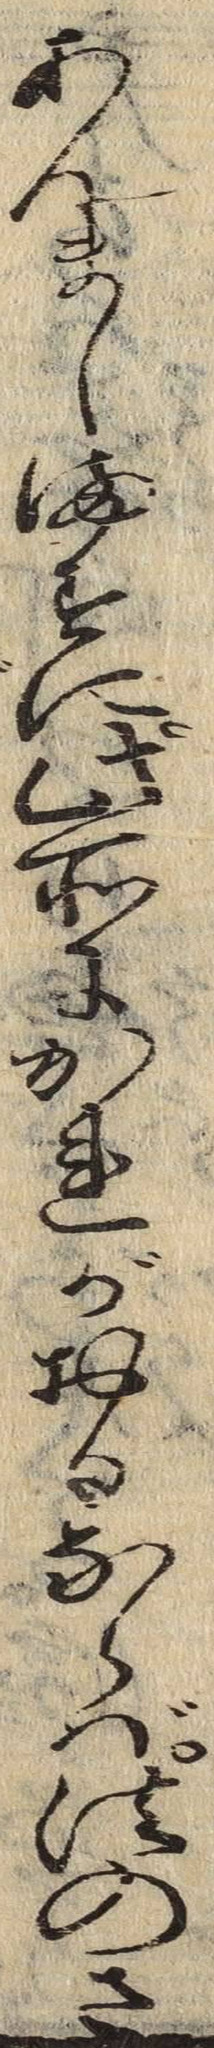あんましますに。此所にかれがおるならば。法のさ
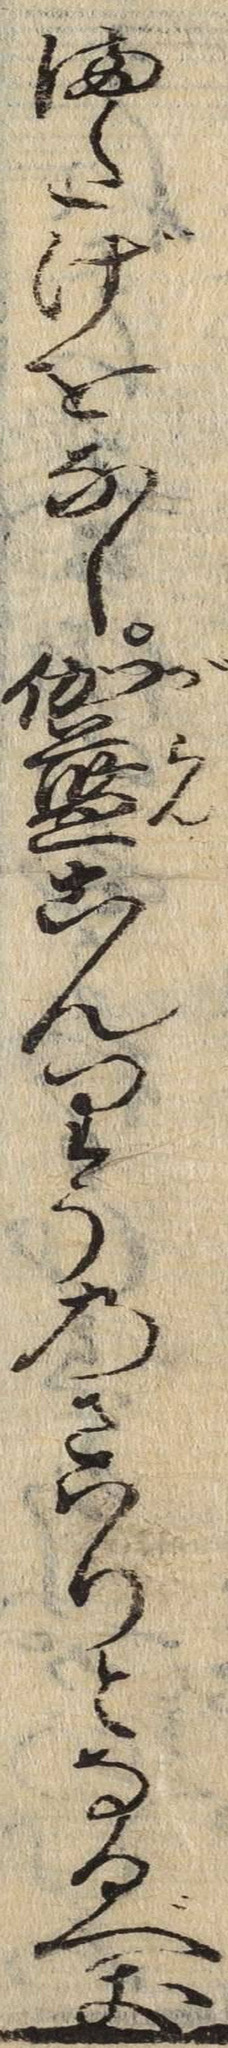またげをなし。伽藍こんりうのさはりとなるべき
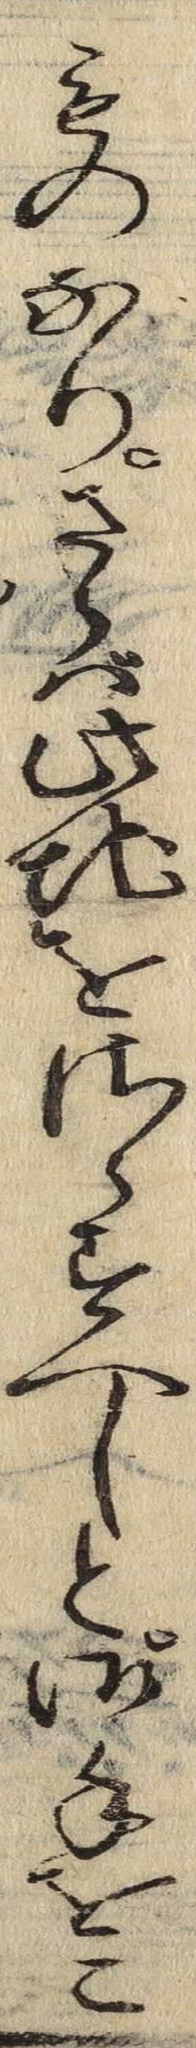ものなり。さらば此地をさらすへしと。御手をこ
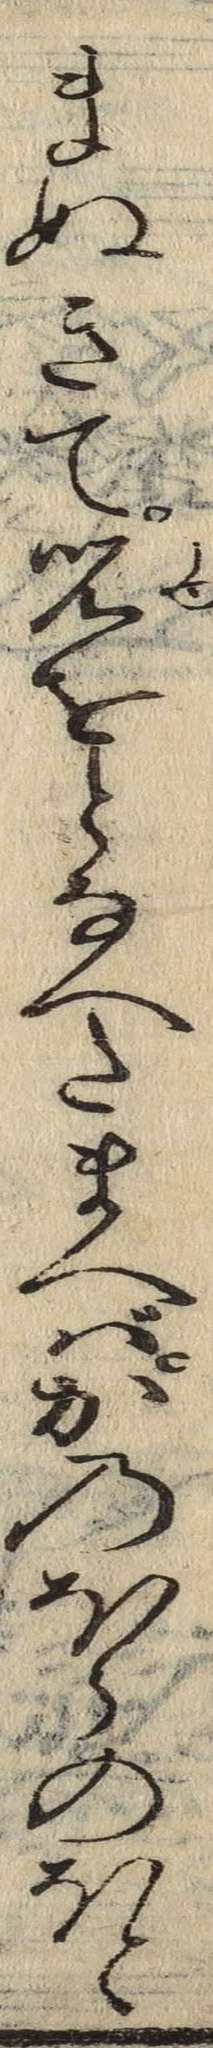まぬきて。呪をとなへたまへば。かのほらのほと
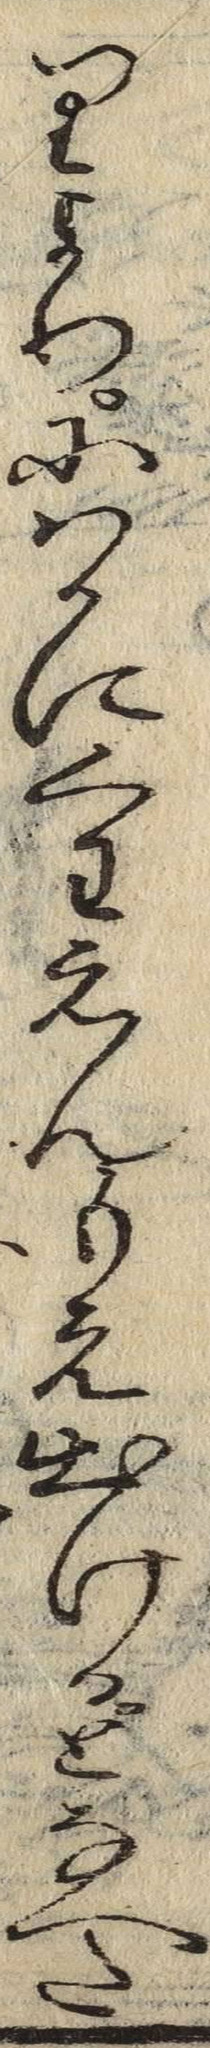りより。にはかにくわえんもえ出ける。となへた
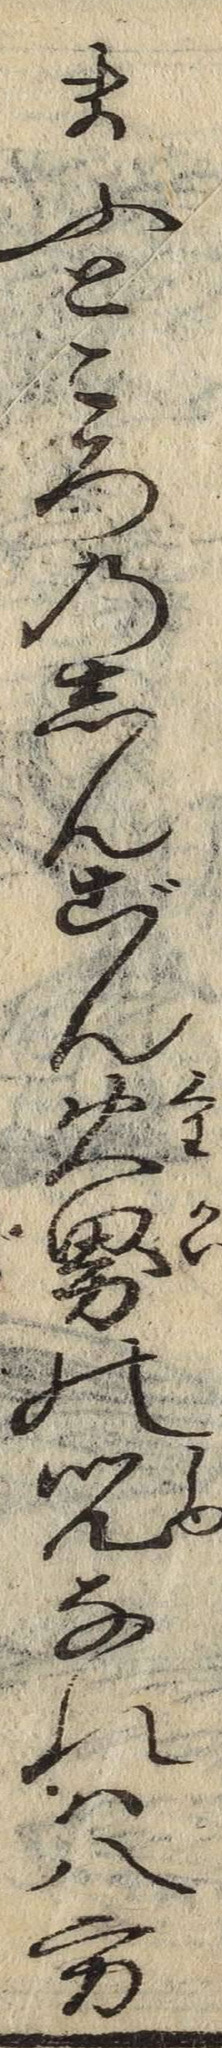まふところのしんごん火界の呪なれは八方
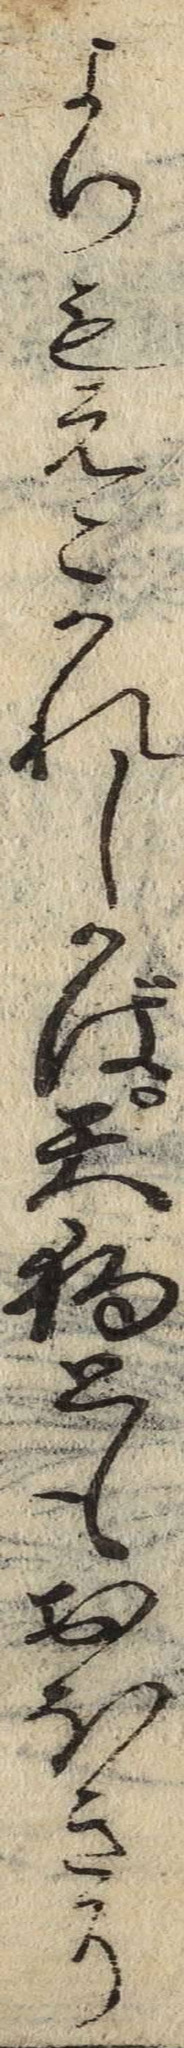よりもえこかれしかば。天狗ともおほきに
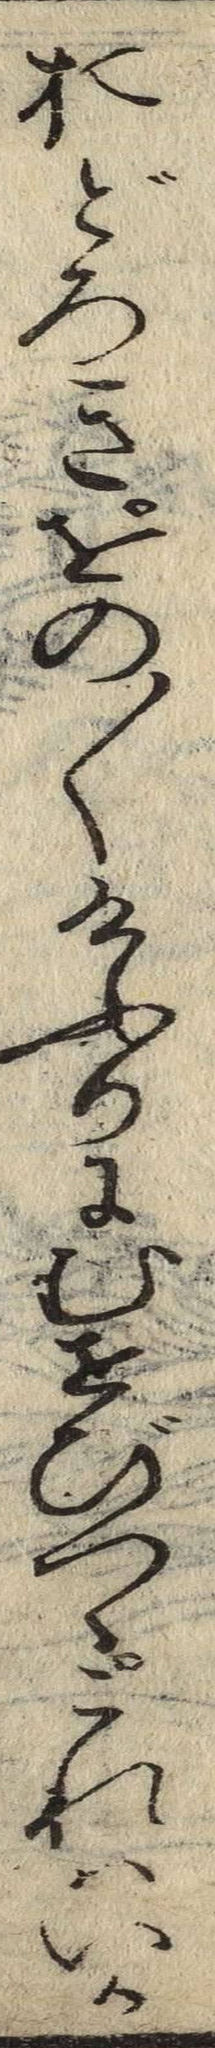おどろき。をの〳〵けふりにむせびつゝ。これはいか
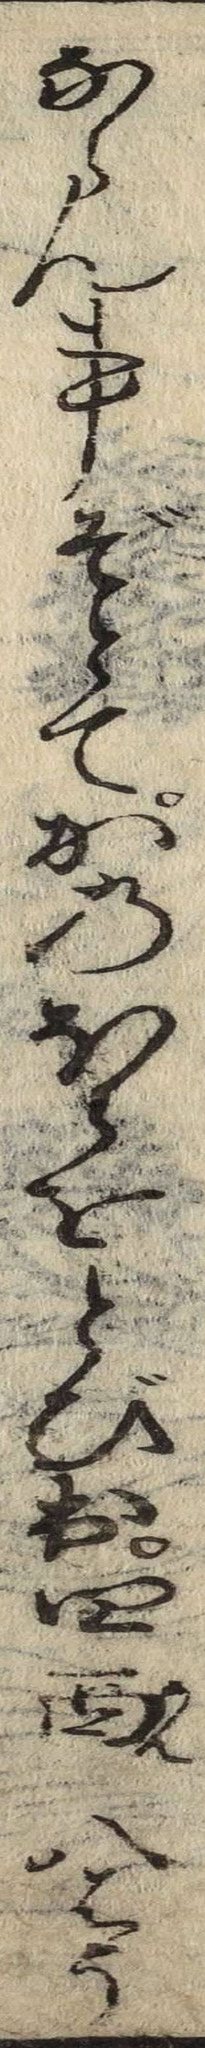ならん事そとて。かのほらをとび出。四面八はう
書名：弘法大師御傳記
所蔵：京都府立京都学・歴彩館 国文学研究資料館
